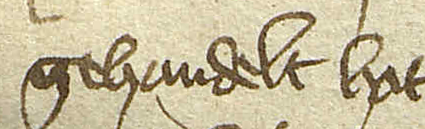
gehandelt hat
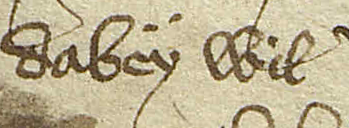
dabey wil
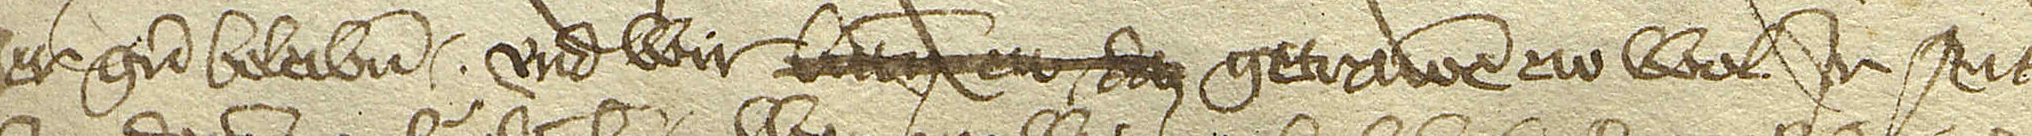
er gn* beleibn* / . vnd wir bittn* ew / daʒ getrawe* ew wol Ir seit
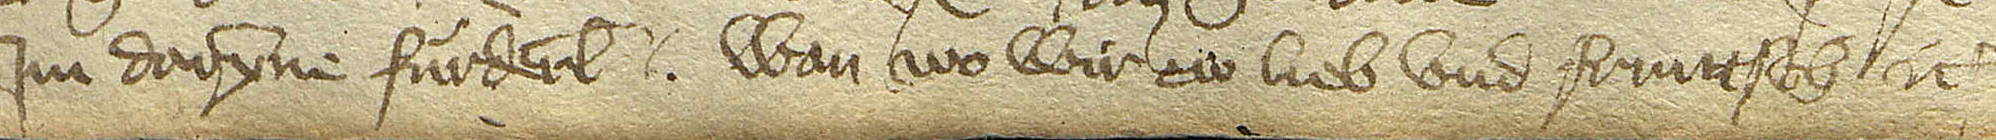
Im daryn*ne fürderl* / . wan wo wir ew lieb vnd freuntſch* ec*
